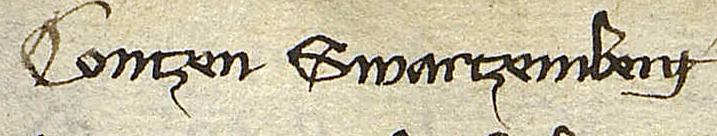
Concʒen Swarcʒemberg*
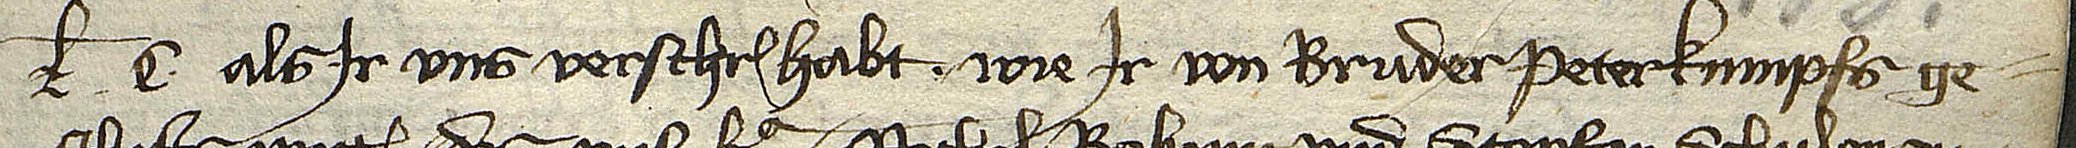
L* . C . als Ir vns verſchr* habt . wie Ir von Bruder Peter Kumpfs ge =
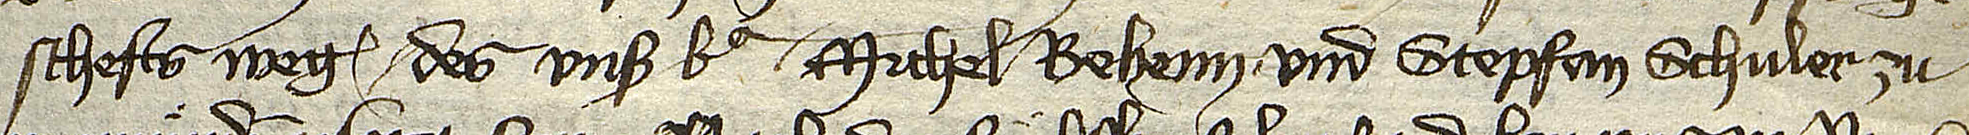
ſchefts weg* / des vnſ* b* / Michel Beheim . vnd Stepfan Schuler ʒu
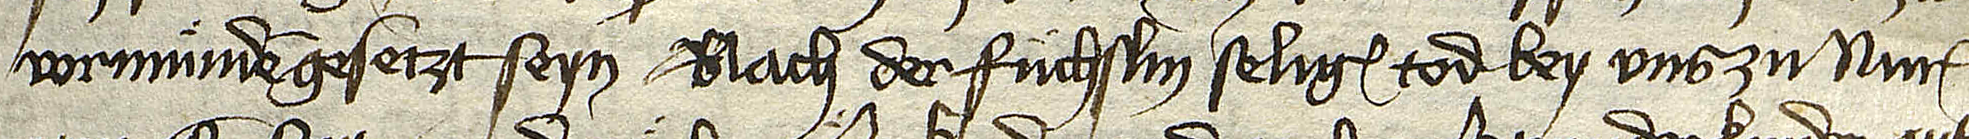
vormünde* geſecʒt ſeyn / Nach der füchſlin ſelig* tod bey vns ʒu Nur*
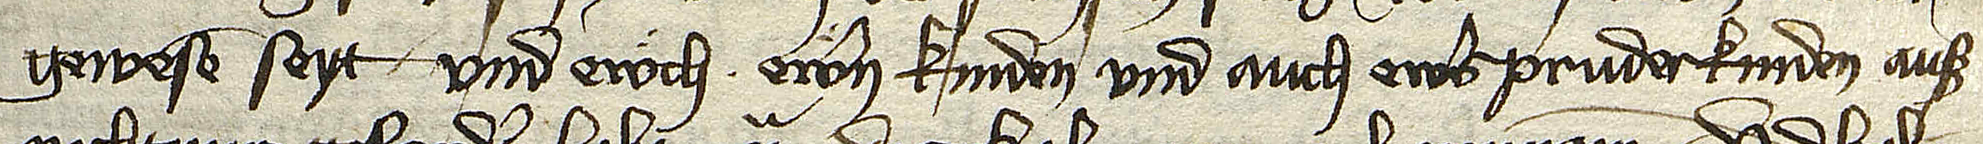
geweſe* ſeyt / vnd ewch . ew*n kinden vnd auch ew*s pruder kinden auſʒ
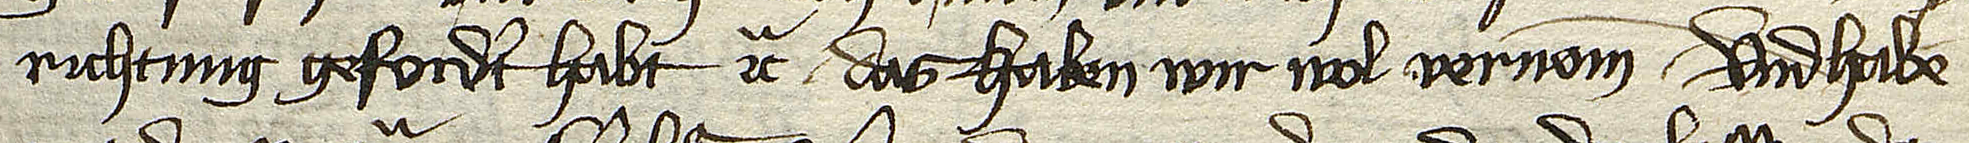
richtung geford*t habt ec* / das haben wir wol vernom* / Vnd habe*
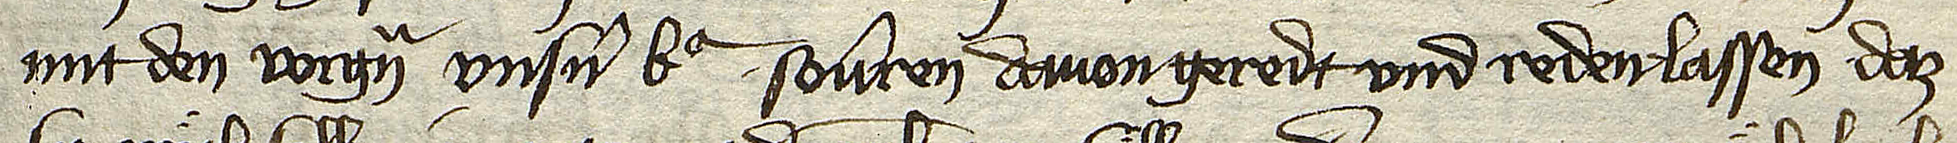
mit den vorgn* vnſ*n b* / ſou*ren dauon geredt vnd reden laſſen daʒ
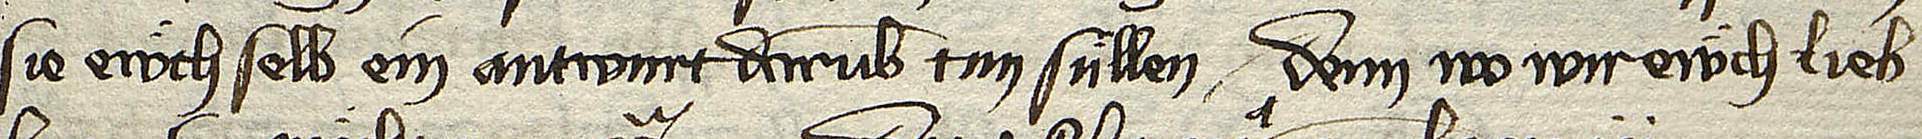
ſie ewch ſelb ein antwurt darub* tun ſüllen / Denn wo wir ewch lieb
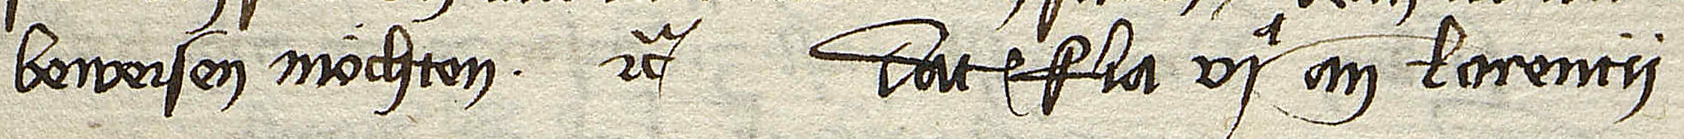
beweiſen möchten . ec* Dat* fia* vi* an* lorencii
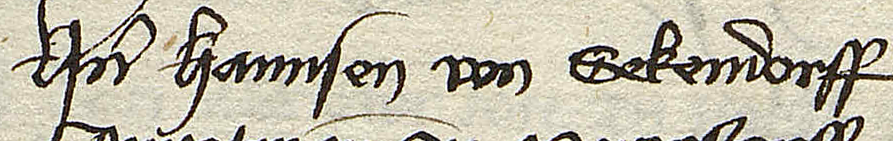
H*n hannſen von Sekendorff
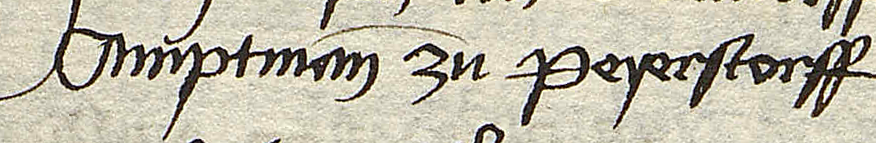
Amptman* ʒu Peyerſtorff
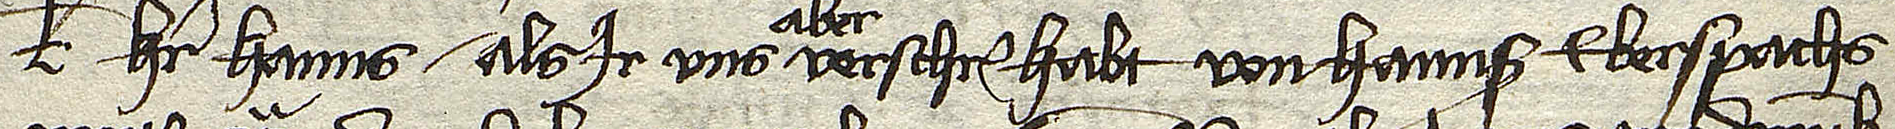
L* h*r hanns / als Ir vns verſchr* habt von hannſ* Eberſpachs
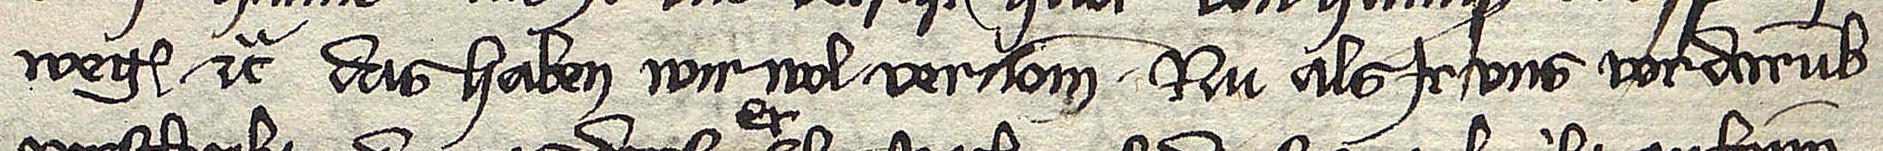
weg* ec* das haben wir wol vernom* / Nu als Ir vns vor darub*
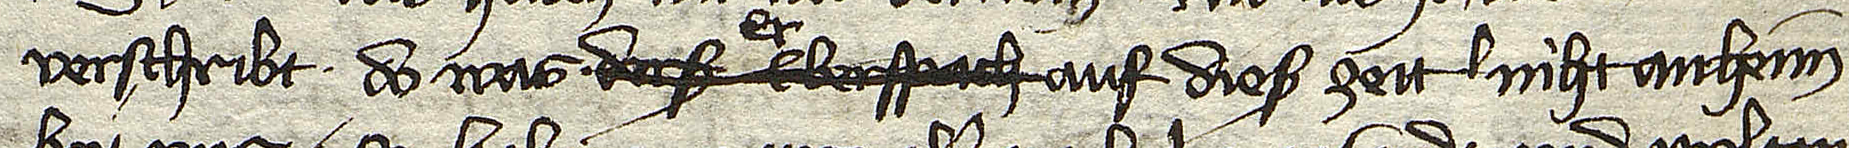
verſchribt . do was . derſ* Eberſpach auf dieſ* ʒeit* niht anheim
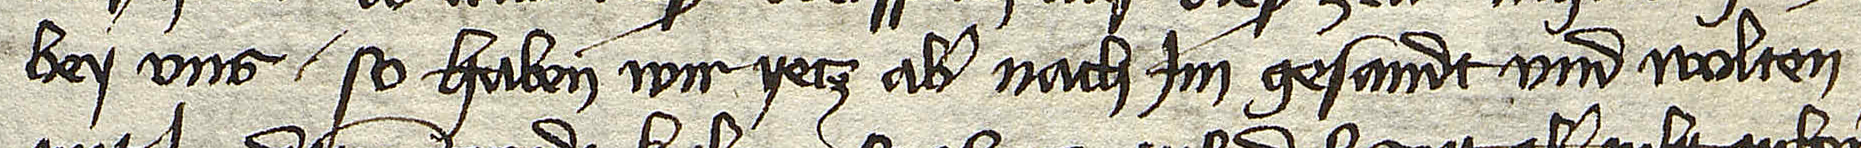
bey vns / ſo haben wir yecʒ ab* nach Im geſandt vnd wolten
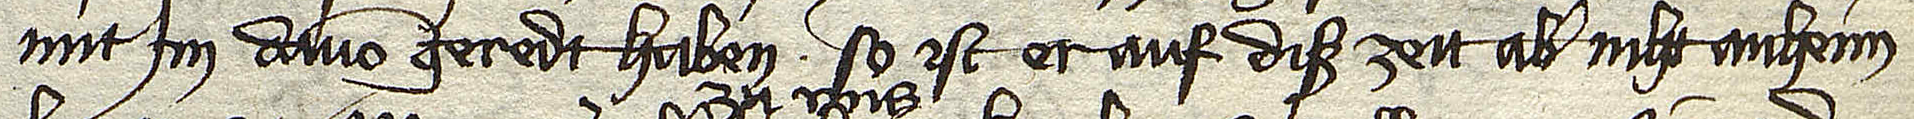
mit Im dauo* geredt haben . ſo iſt er auf diſʒ ʒeit ab* niht anheim
